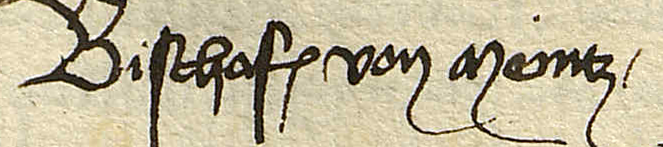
Biſchof* von Meintʒ /
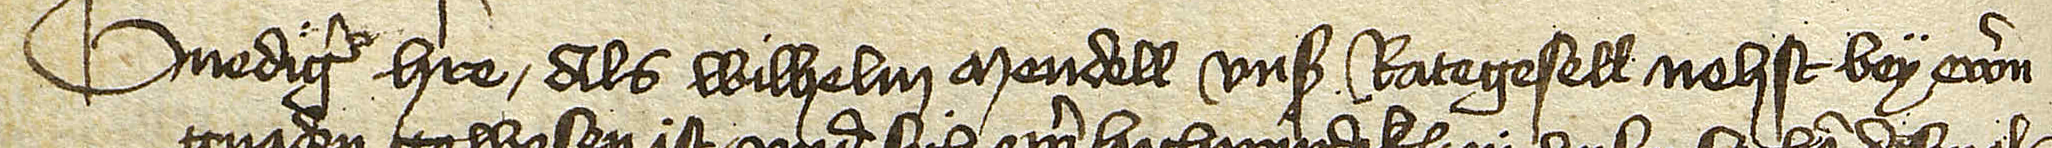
Gnedig* h*re / Als wilhelm Mendell vnſ* Rategeſell nehſt bey ewn*
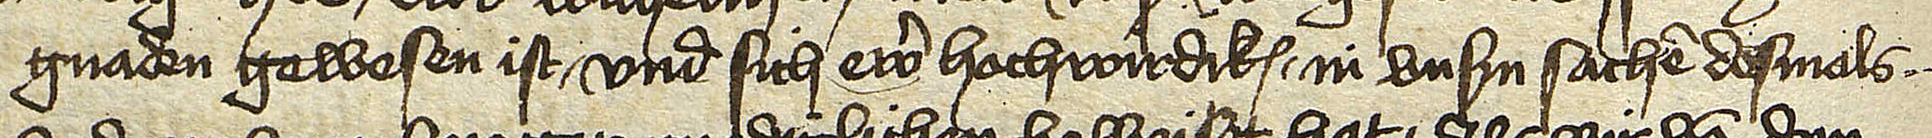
gnaden geweſen iſt / vnd ſich ew* hochwirdik* / in vnſ*n ſache* deſmals
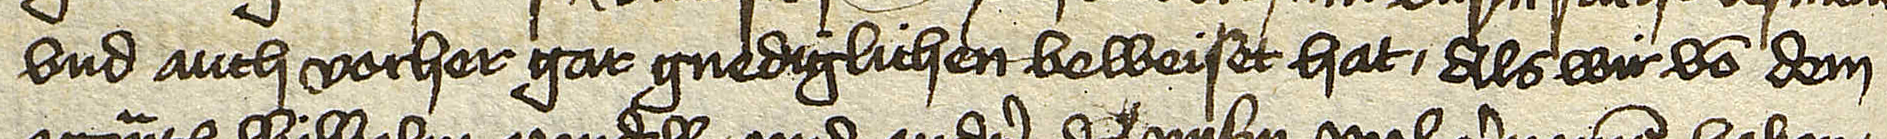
vnd auch vorher gar gnediglichen beweiſet hat / Als wir vo* dem
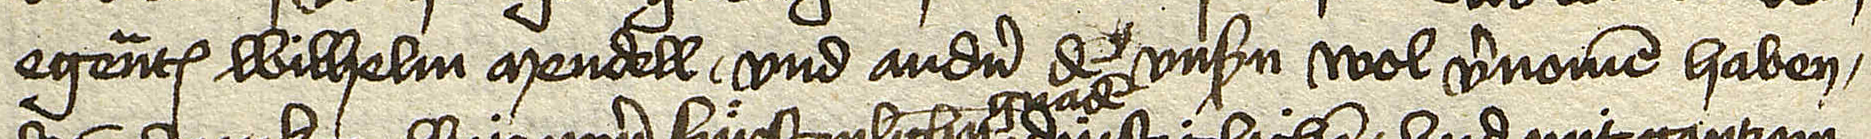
egent* wilhelm Mendell / vnd andn* d* vnſ*n wol v*nome* haben /
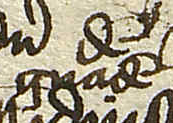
gnad*
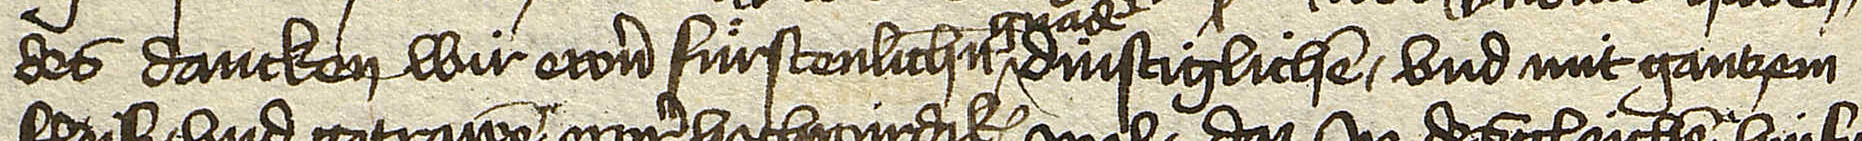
des dancken wir ewn* fürſtenlichn* dinſtigliche* / vnd mit gantʒem
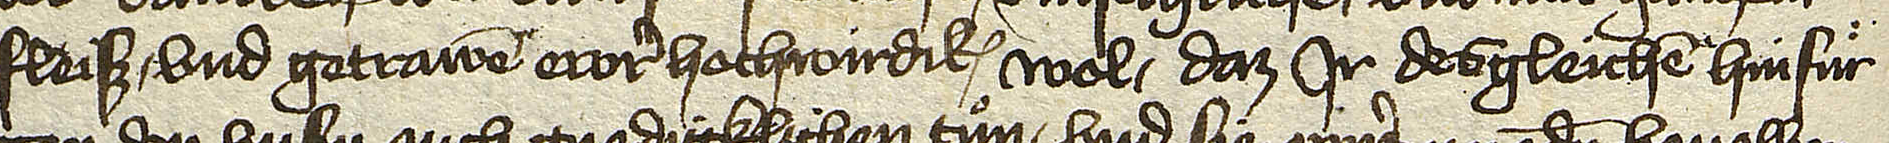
fleiſʒ / vnd getrawe* ewr* hochwirdik* wol / daʒ Ir desgleiche* hinfür
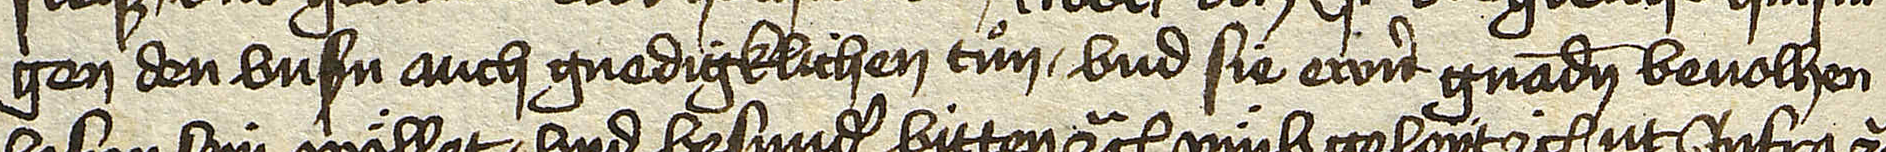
gen den vnſ*n auch gnedigklichen tün / vnd ſie ewn* gnadn* beuolhen
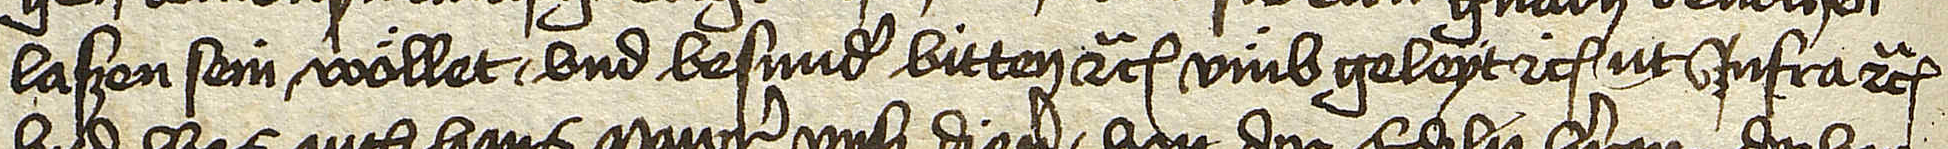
laſʒen ſein wöllet / vnd beſund* bitten ec* v̈mb geleyt ec* ut Infra ec*
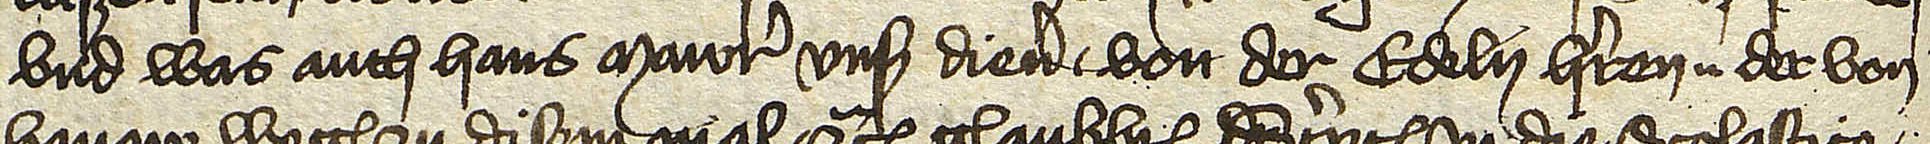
vnd was auch hans Mawr* vnſ* dien* / von der Edeln h*ren ~ der von
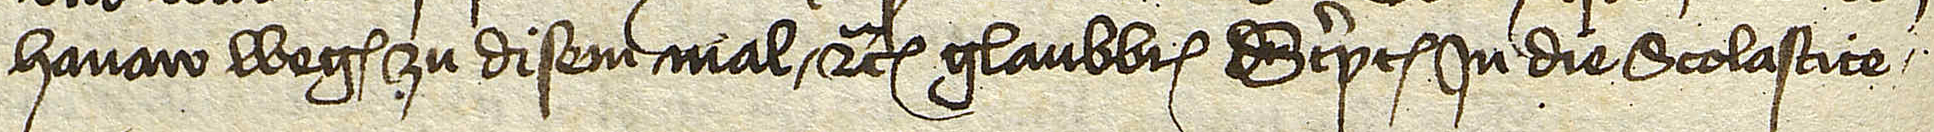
hanaw weg* cʒu diſem mal / ec* glaubbr* S*cpt* In die Scolaſtice /
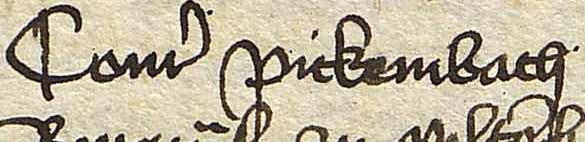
Conr* Pickembach
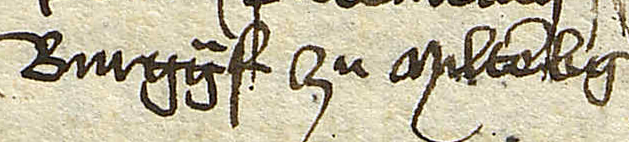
Burgg*f cʒu Milte*bg*
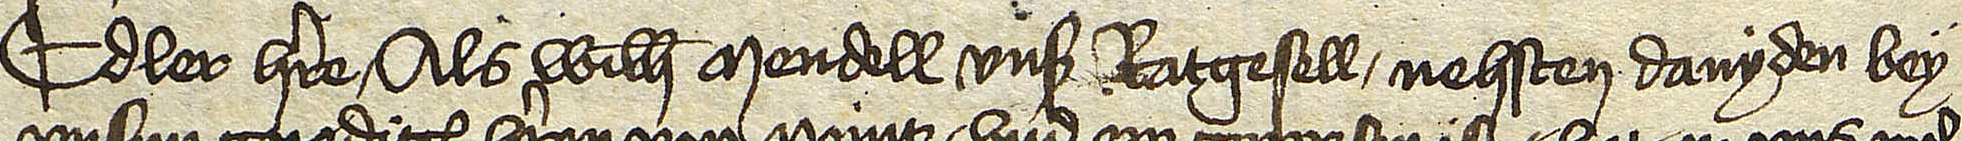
Edler h*re / Als wilh* Mendell vnſ* Ratgeſell / nehſten danyden bey
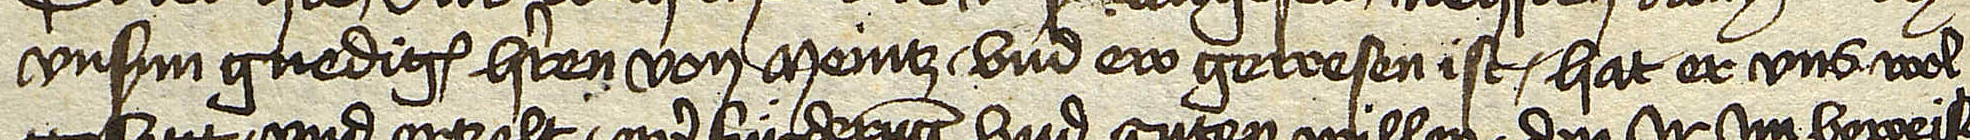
vnſ*m gnedig* h*ren von Meintʒ / vnd ew geweſen iſt / hat er vns wol
